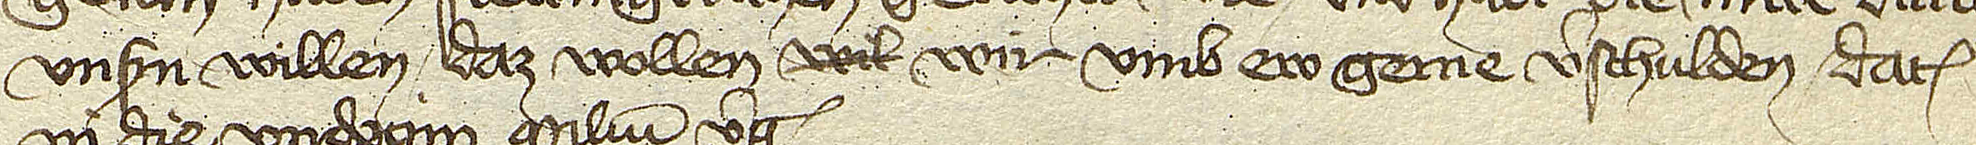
vnſ*n willen / daʒ wollen wil wir vmb ew gerne v*ſchulden / dat*
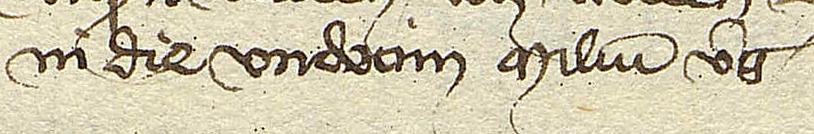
in die vndecim an* Miliu* v*g*
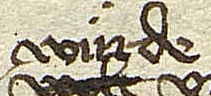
würde
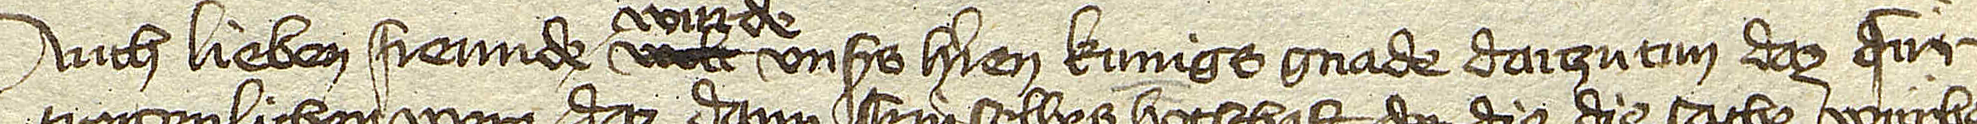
Auch lieben freunde / wolt vnſ*s h*ren kunigs gnade darcʒu tun daʒ %%%
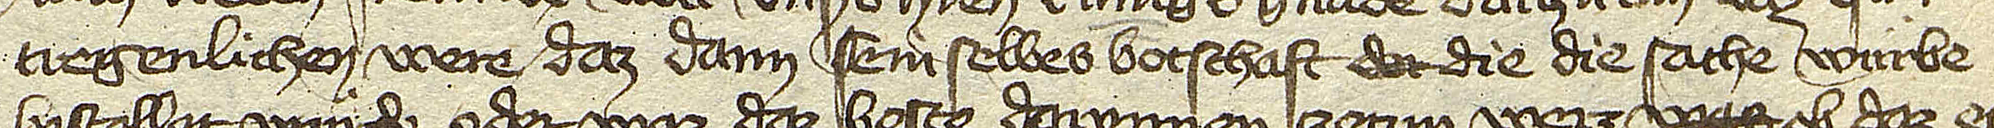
tregenlichen were / daʒ dann ſein ſelbes botſchaft der die die ſache würbe
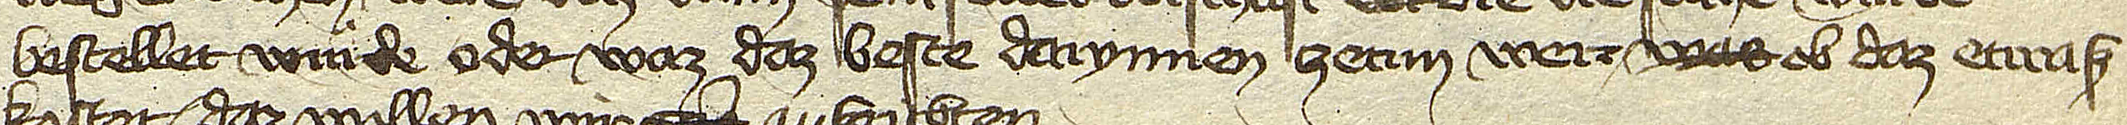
beſtellet würde oder waʒ beſte darynnen cʒetun wer . / was ob daʒ etwaſʒ
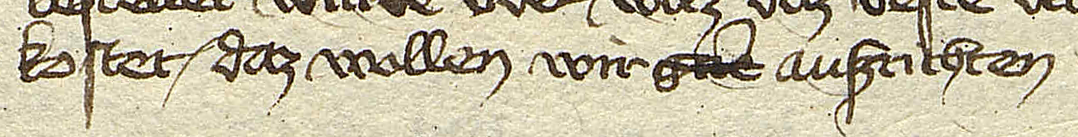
koſtet / daʒ wollen wir gne* auſʒrichten
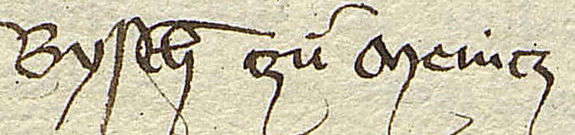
Byſch* cʒü Meincʒ
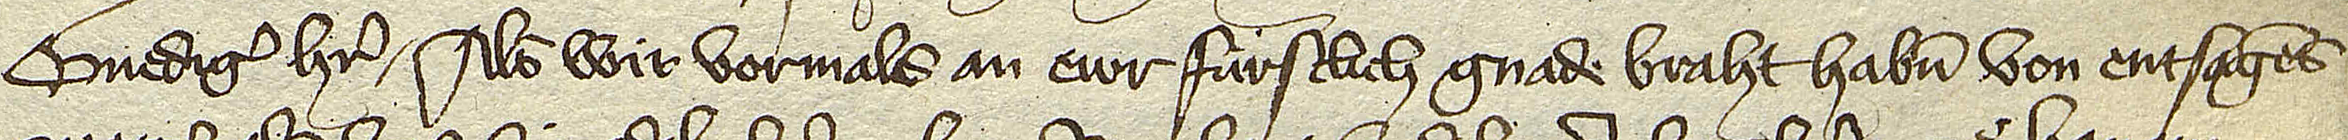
Gnedig* hr* / Als wir vormals an ewr fürſtlich gnade braht habn* von entſage*s
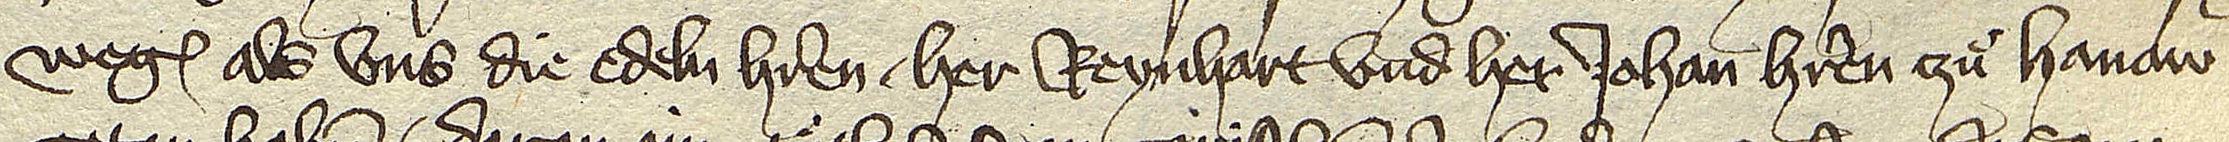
weg* als vns die edeln hr*en / her Reynhart vnd her Iohan hr*en cʒü hanaw
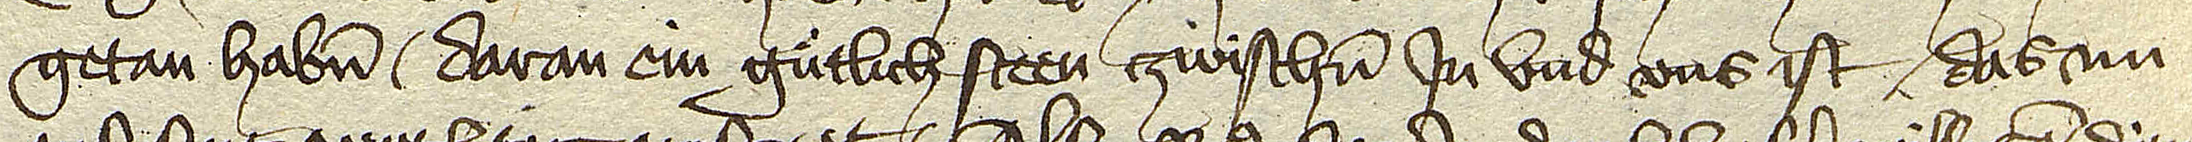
getan habn* / daran ein gütlich ſteen cʒwiſchn* In vnd vns iſt / das nu
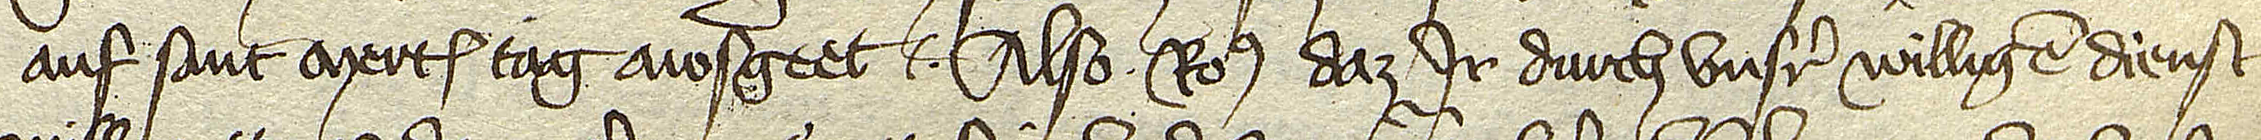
auf ſant Mert* tag awſgeet / Alſo Ro* daʒ Ir durch vnſr* willige* dienſt
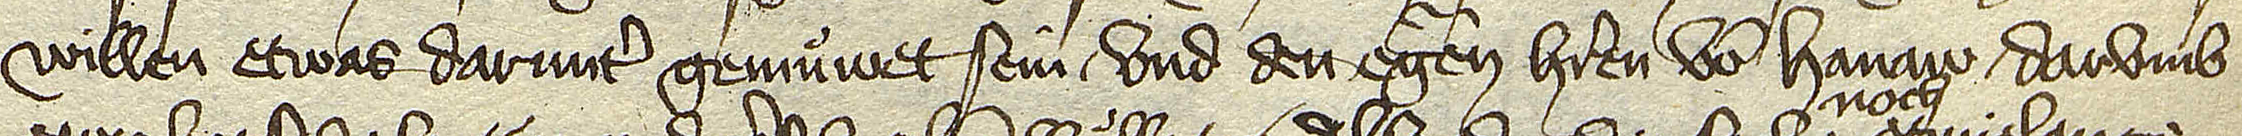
willen etwas darunt* gemüwet ſein / vnd den egen* hr*en vo* hanaw / darvmb
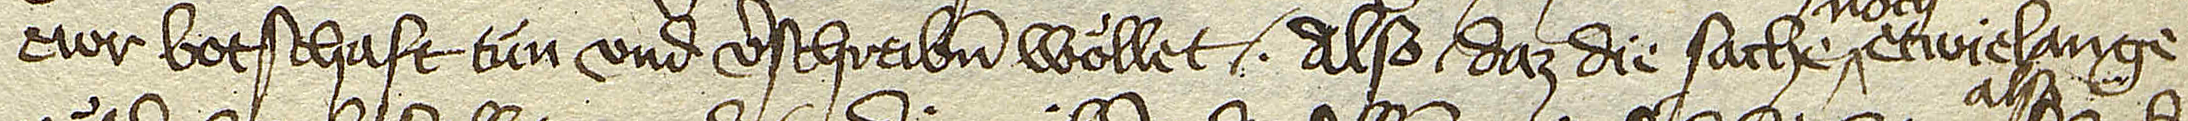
ewr botſchaft tün vnd v*ſchreibn* wöllet / . Alſo / daʒ die ſache etwielange
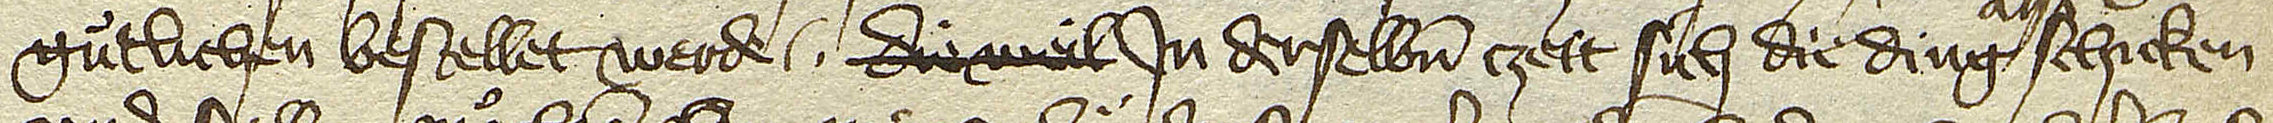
gütlichen beſtellet werde / . die weil In derſelbn* cʒeit ſich die ding ſchicken
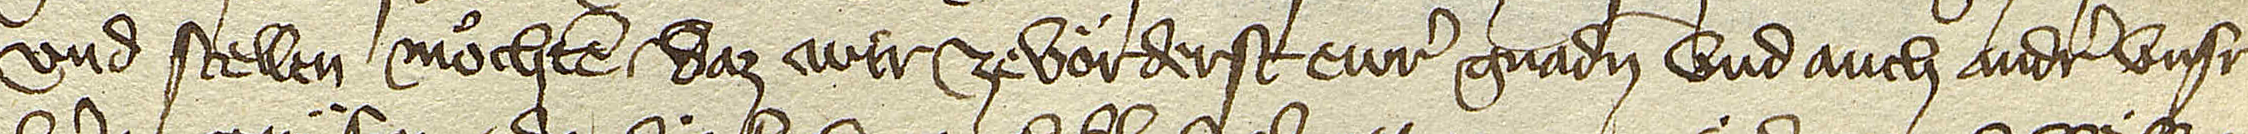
vnd ſtellen möchte* / daʒ wir cʒevörderſt ewr* gnadn* vnd auch andr* vnſr*
